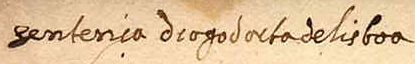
sentença diogo dorta de lisboa
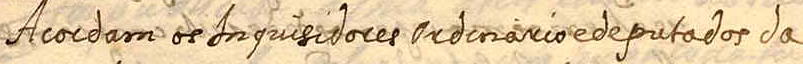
Acordam os Jnquisidores ordinario deputados da
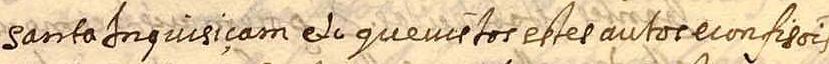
santa Jnquisiçam etc que vistos estes autos e confisõis
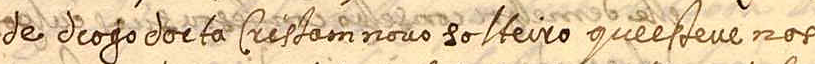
de diogo dorta Cristam novo solteiro que esteve nas
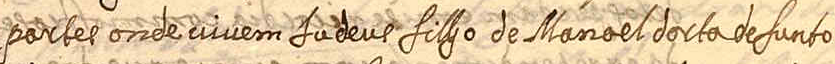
partes onde vivem Judeus filho de Manoel dorta defunto
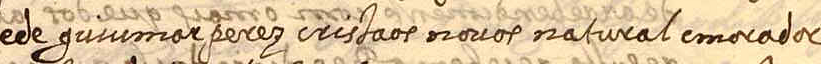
e de guiumar perez cristaos novos natural e morador
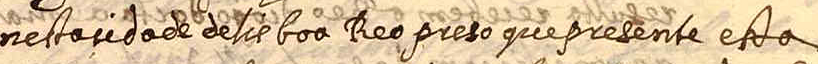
nesta çidade de lisboa Reo preso que presente esta
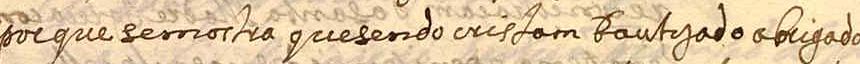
porque se mostra que sendo cristam Bautizado obrigado
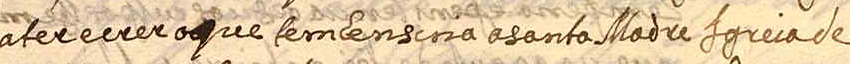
a ter e crer o que tem e ensina a santa Madre Jgreia de
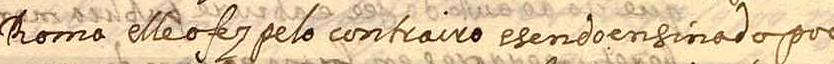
Roma elle o fez pelo contrairo e sendo ensinado por
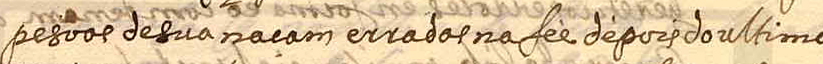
pesoas de sua naçam erradas na fée depois do ultimo
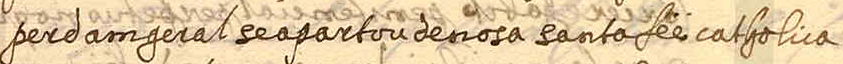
perdam geral se apartou de nosa santa fée catholica
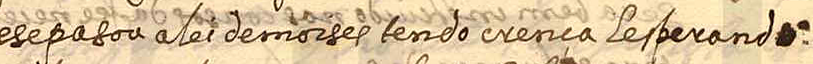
e se pasou a lei de moises tendo crença e esperando:
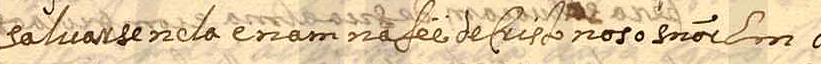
salvarse nela e nam na fée de Cristo noso snōr em o
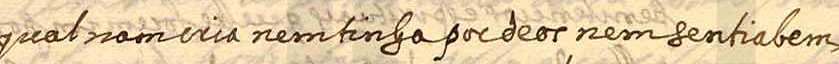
qual nam cria nem tinha por deos nem sentia bem
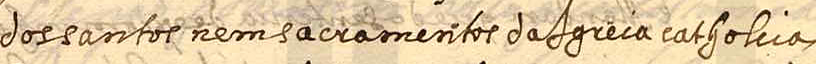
dos santos nem sacramentos da Jgreia catholica
